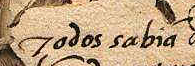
Todos sabiā
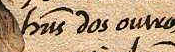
hūs dos outros
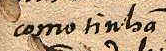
como tinhā
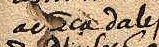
a c_ēça da lej
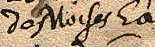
de Moises ha
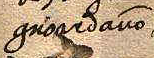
guoardauō
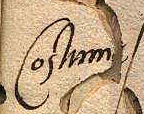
Costum
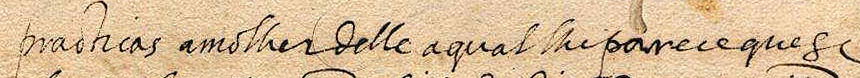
practicas a molher delle a qual lhe parece que se
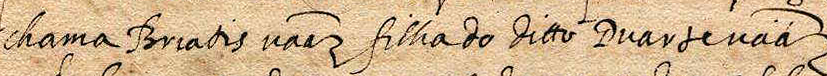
chama Briatis uaāz filha do ditto Duarte uaāz
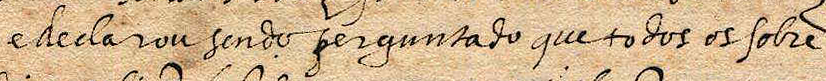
e declarou sendo perguntado que todos os sobre
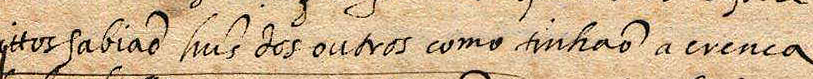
dittos sabiaõ hus̄ dos outros como tinhaõ a crença
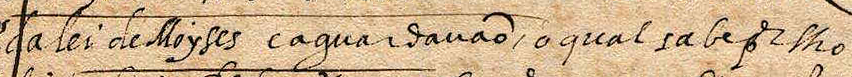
da lei de Moyses e a guardauaõ, o qual sabe por lho
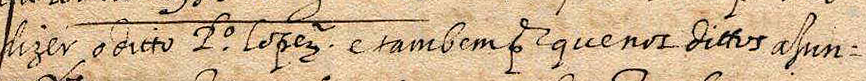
dizer o ditto Po lopez̄. e tambem porque nos dittos aJun
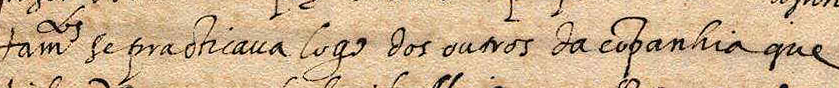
tamtos se practicaua logo dos outros da cōpanhia que
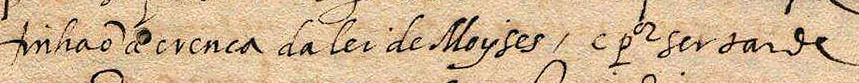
tinhaõ a crença da lei de Moyses, e por ser tarde
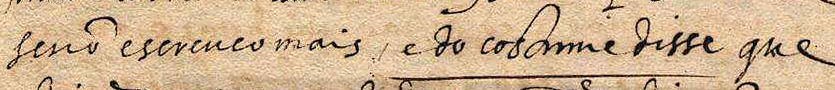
se nō escreueo mais, e do costume disse que
